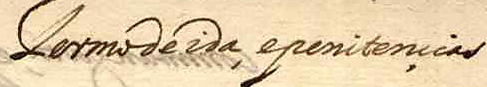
Termo de ida, e penitencias
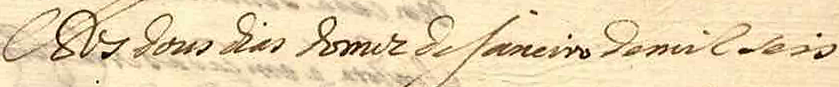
Aos dous dias do mez de Janeiro de mil seis
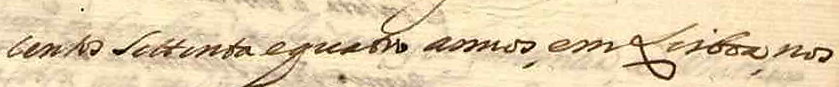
centos settenta e quatro annos, em Lisboa, nos
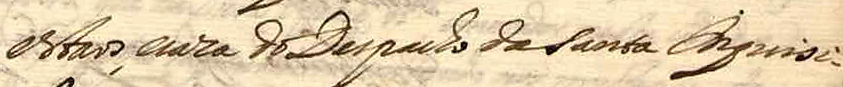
estaos, e caza do Despacho da santa Inquisi
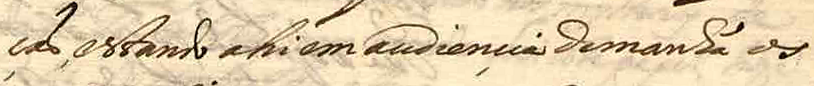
çaõ, estando ahi em audiencia de manhã os
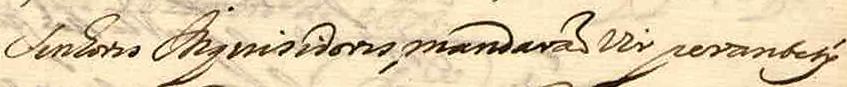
Senhores Jnquisidores, mandaraõ uir perante sy
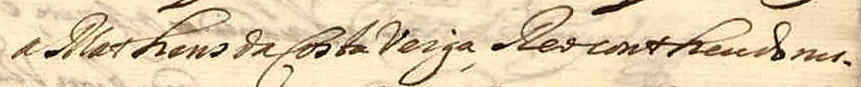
a Matheus da Costa Veiga, Reo conteudo nes
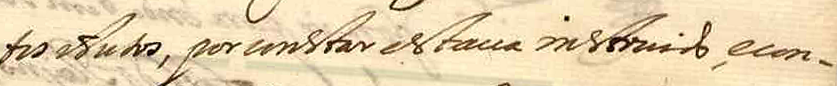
tes Autos, por constar estaua instruido, e con
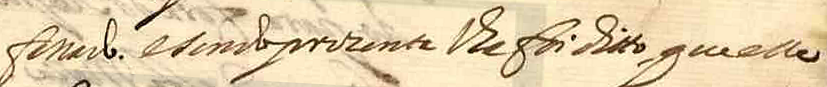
fessado. e sendo prezente lhe foi ditto, que elle
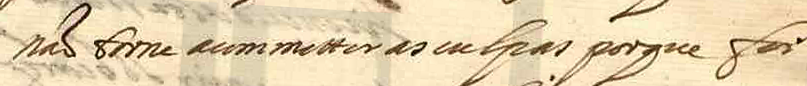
naõ torne a commeter as culpas por que foi
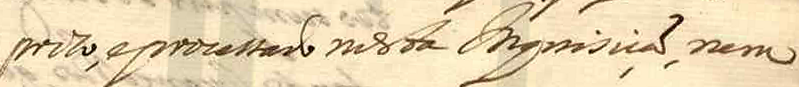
prezo, e processado nesta Inquisição, nem
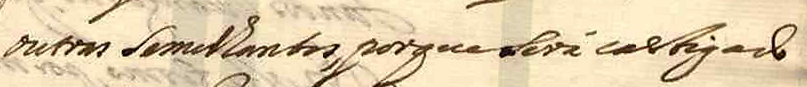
outras semelhantes, porque será castigado
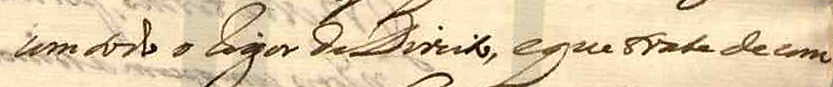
com todo o Rigor de Direito, e que trata de com
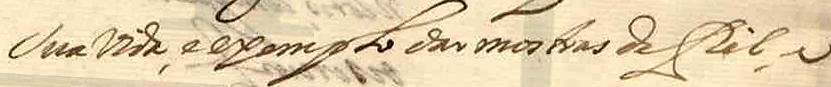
Sua Vida, e exemplo dar mostras de fiel, e
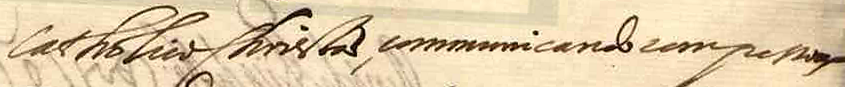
Catholico Christaõ, communicando com pessoas
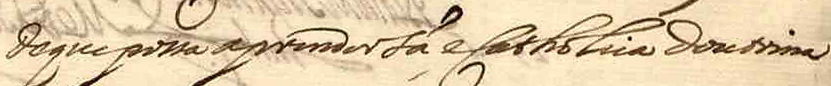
de que possa aprender sã, e Catholica doutrina
